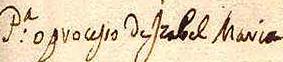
P:a o processo de Jzabel Maria
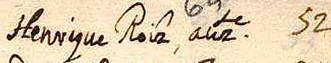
Henrique Roiz̄, auz.te
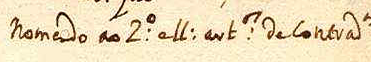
nomeado ao 2o: e 11: artos: de contradas.
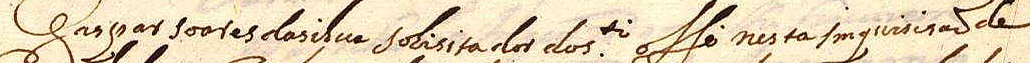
Gaspar soares da silua solisitador do s.to offo. nesta Imquisisaõ de
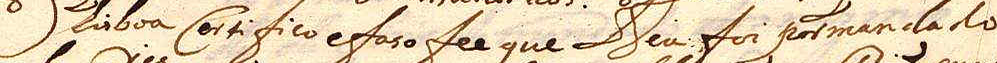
lisboa Certifico e faso fee que eu fui por mandado
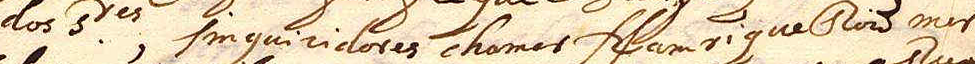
dos s.res; jmquizidores chamar Hamrique Roiz̄ mer
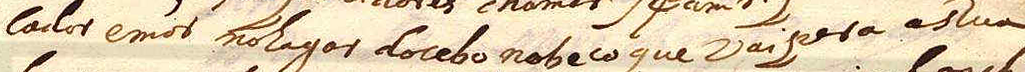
Cador e mor no logar do cebo no beco que vai para a Rua
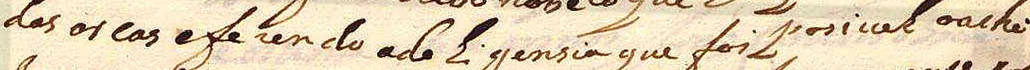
das arcas e fazendo a deligensia que foi posiuel o achei
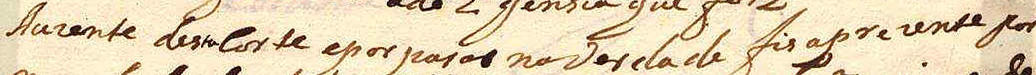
Auzente desta Corte e por pasar na Verdade fis a prezente por
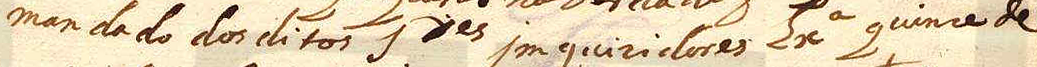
mandado dos ditos S.res Jmquizidores Lxa quinze de
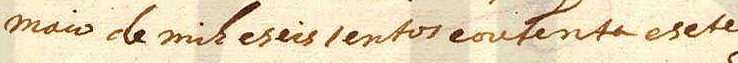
maio de mil e seissentos e outenta e sete
